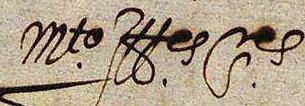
mt.o Jl̄l.es s.res
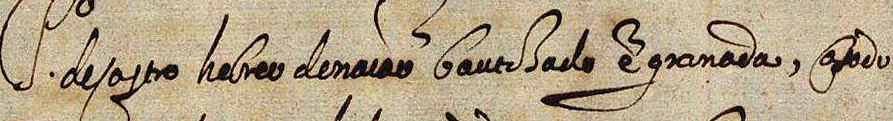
P.o de Castro hebreo de naçaõ bautizado ē granada, Casado
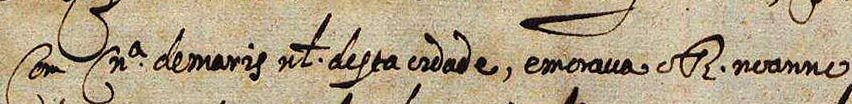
Com Cn.a de maris nl̄. desta cidade, e moraua o R. no anno
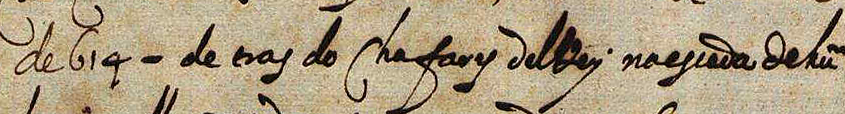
de 614 - de tras do Chafaris del Rey na escada de hū
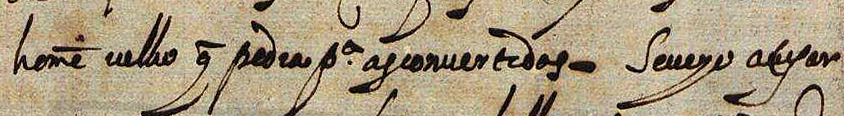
homē uelho q̄ pedia p.a as conuertidas - Se ueyo acusar
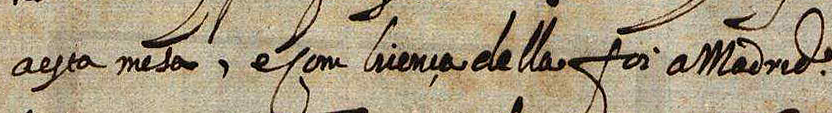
a esta mesa, e Com licença della foi a Madrid.
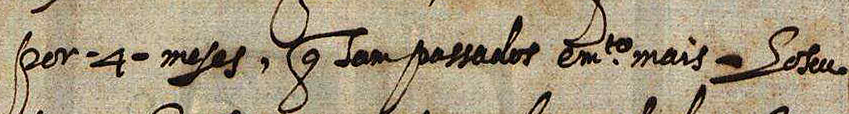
por -4- meses, q̄ sam passados e m.to mais - E o seu
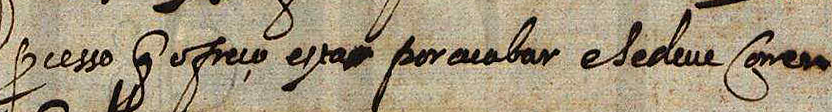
ꝓcesso q̄ ofreço esta por acabar e se deue Correr
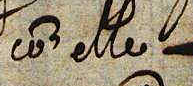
cō elle -
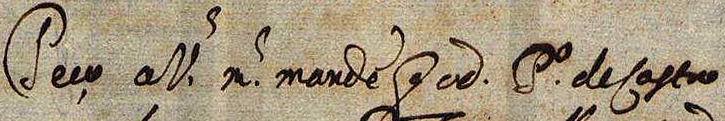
Peço a Vs. ms. mandē q̄ o d. P.o de Castro
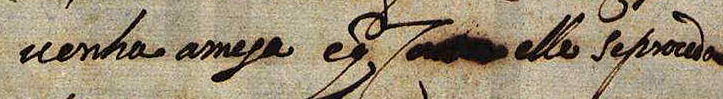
uenha a mesa e q̄ Com elle se proceda
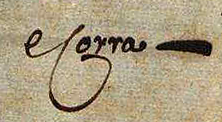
e Corra -
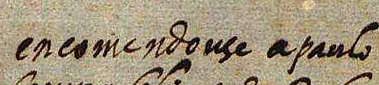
encomendouse a paulo
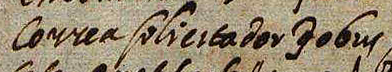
correa solicitador q̄ o bus
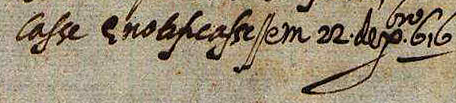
casse E notificasse // em 22. de x.bro 616
